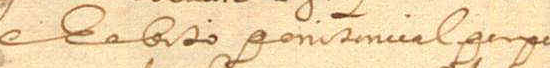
e habito penitencial perpe
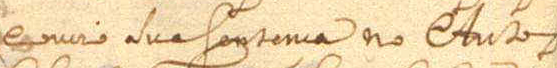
e ouuio sua sentença no Auto
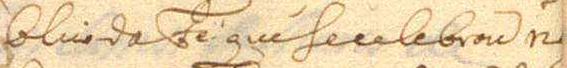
blico da Fé que se celebrou n
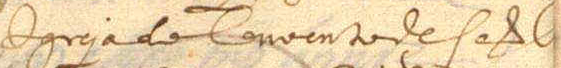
Igreja do Convento de saõ
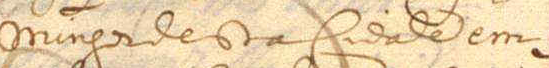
mingos desta Cidade em
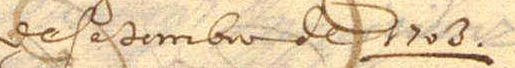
de setembro de 1703.
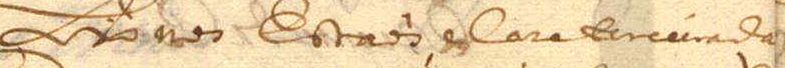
Lixa nos Estaós e Caza terceira da
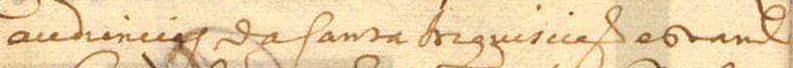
audiencias da santa Inquisiçaõ estand
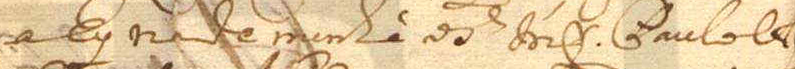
ahy na de menhã o sor Inqr Paulo A
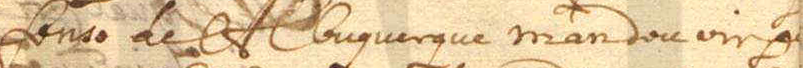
fonso de Albuquerque mandou vir p
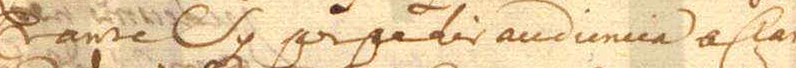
rante Sy por pedir audiencia a Clar
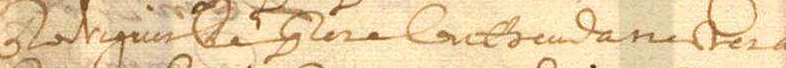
Rodrigues Re preza Contheuda nestes
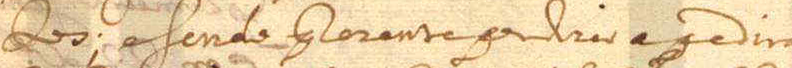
tos; e sendo prezente por dizer a pedira
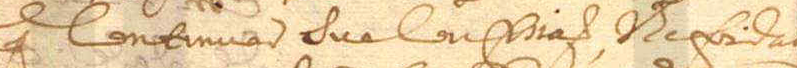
p̄a Continuar sua Confissaõ, lhe foi da
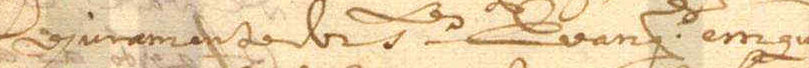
o juramento dos s.tos Evang.os em qu
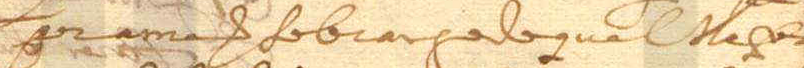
pos a maõ sob cargo do qual lhe foi
